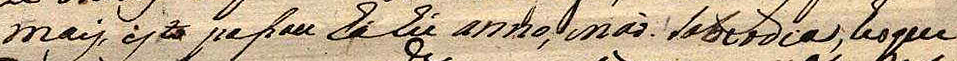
mais, isto passou há hū anno, e naõ. sabe o dia, he o que
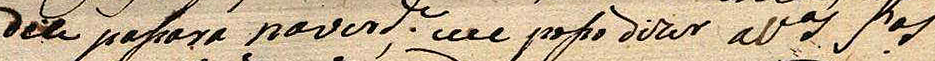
dice passara na verd;e e eu posso dizer a Vas S.as
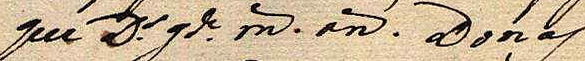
que D.s gd.e m̄ an̄. Donas
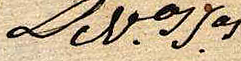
De V.as S.as
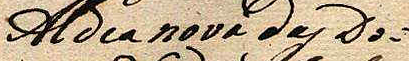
Aldea nova das Do
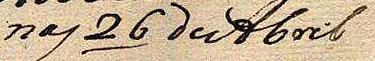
nas 26 de Abril
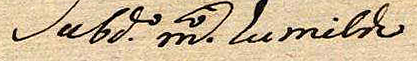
Subd.o m.to humilde
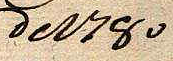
de 1780
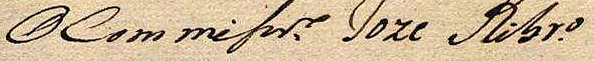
O Commissr.o Ioze Ribr.o
